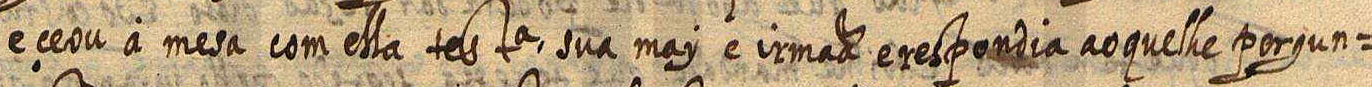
e çeou a mesa com ella testa. sua may e irmaā e respondia ao que lhe pergun
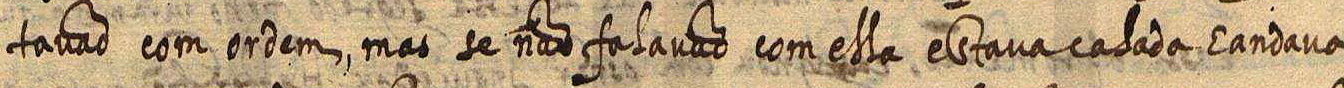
tauão com ordem, mas se não falauão com ella estaua calada E andaua
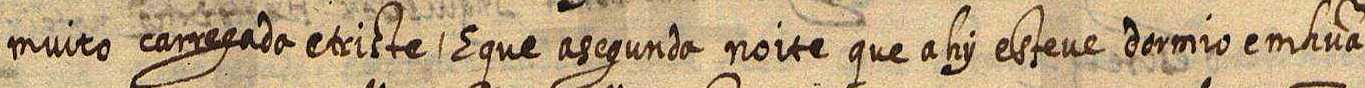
muito carregada e triste / E que a segunda noite que ahy esteue dormio em huā
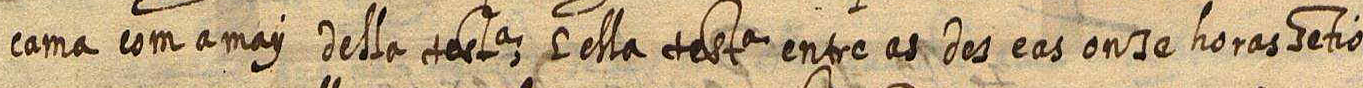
cama com a may della testa, E ella testa entre as des e as onze horas sētio
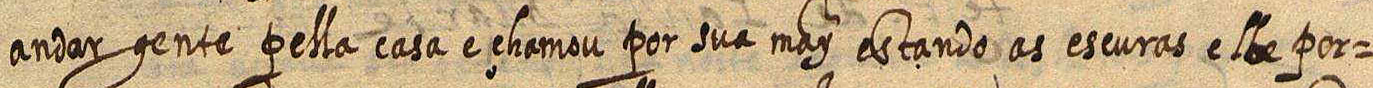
andar gente pella casa e çhamou por sua mãy estando as escuras e lhe per
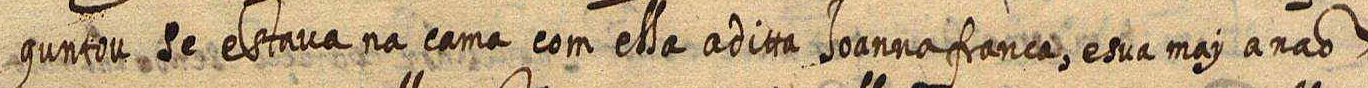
guntou se estaua na cama com ella a ditta Ioanna franca, e sua may a naõ
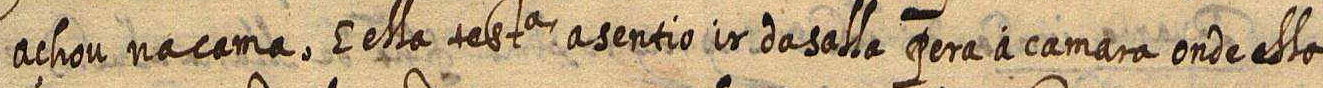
açhou na cama, E ella testa a sentio ir da salla pera a camara onde ella
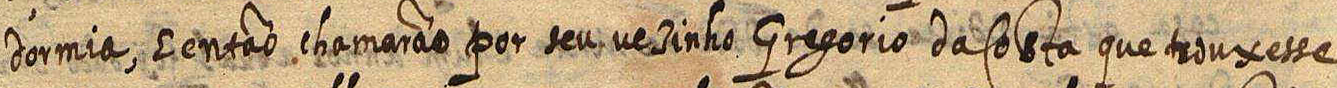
dormia, E então chamarão por seu uezinho Gregorio da Costa que trouxesse
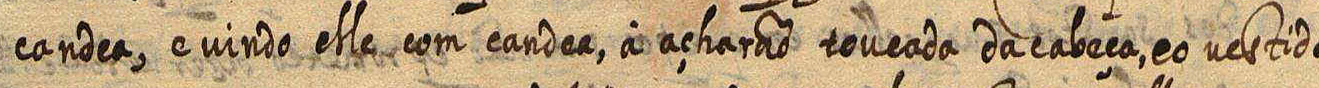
candea, e uindo elle com candea, a açharão toucada da cabeça, e o uestido
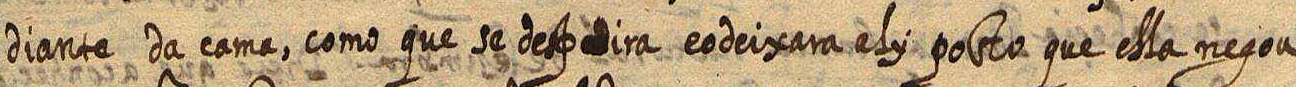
diante da cama, como que se desp_ira e o deixara aly posto que ella negou
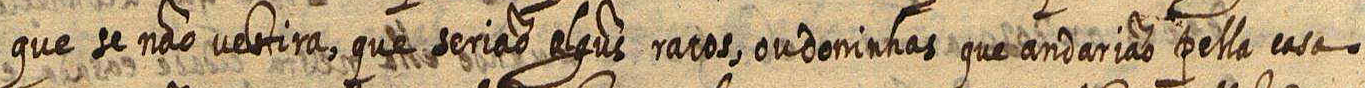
que se não uestira, que seriaõ algūs ratos, ou doninhas que andarião pella casa
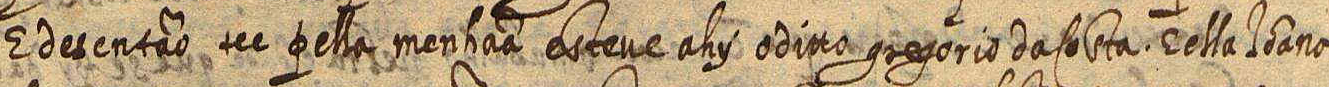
E des então tee pella menhaã esteue ahy o ditto gregorio da Costa. E ella Ioāna
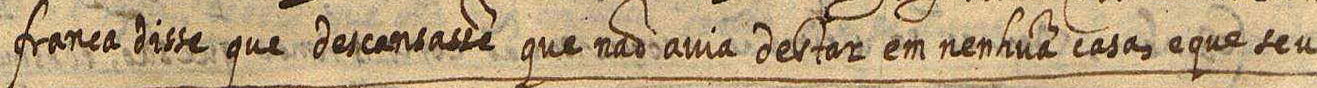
franca disse que descansassē que não auia destar em nenhuā casa, e que seu
